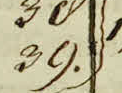39.
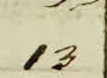13
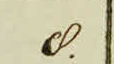8.
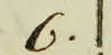6.
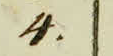4.
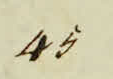45
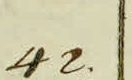42.
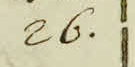26.
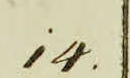14.
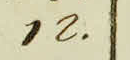12.
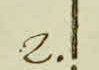2.
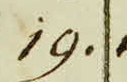19.
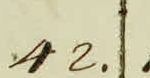42.
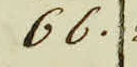66.
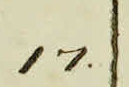17.
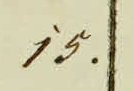15.
